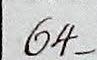64
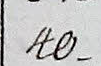40
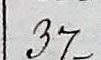37
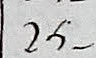25
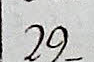29
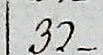32
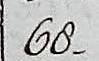68
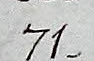71
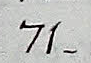71
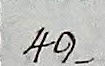49
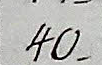40
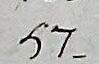57
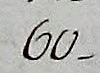60
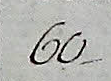60.
